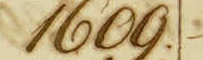1609.
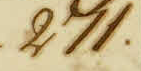271.
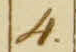4.
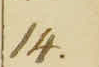14.
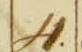4.
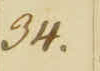34.
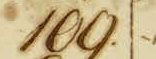109.
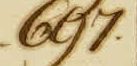697.
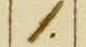1.
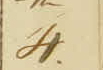4.
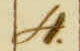4.
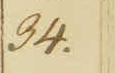34.
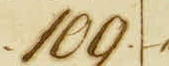109.
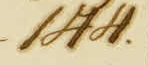144.
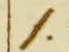1.
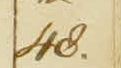48.
